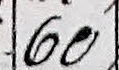60
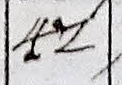42
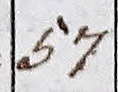57
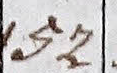52
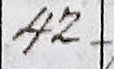42
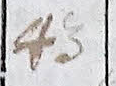43
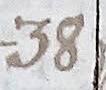38
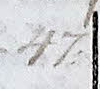47
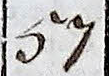57
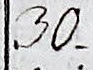30
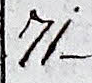71
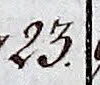23.
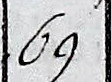69
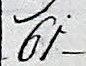61
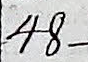48
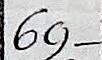69
